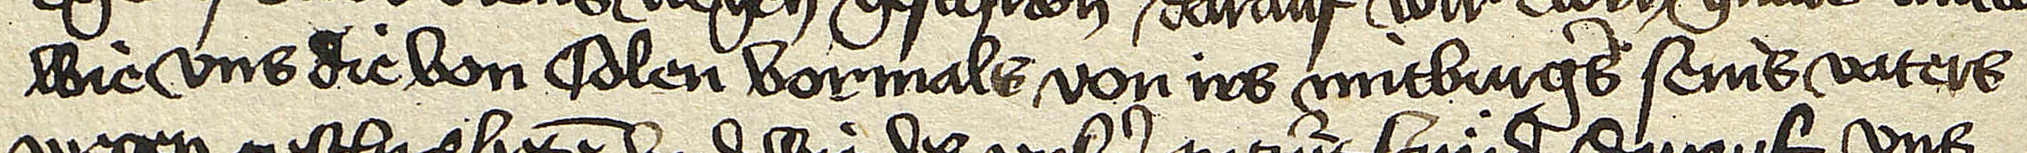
wie vns die von Colen vormals von irs mitburgs* ſeins vaters
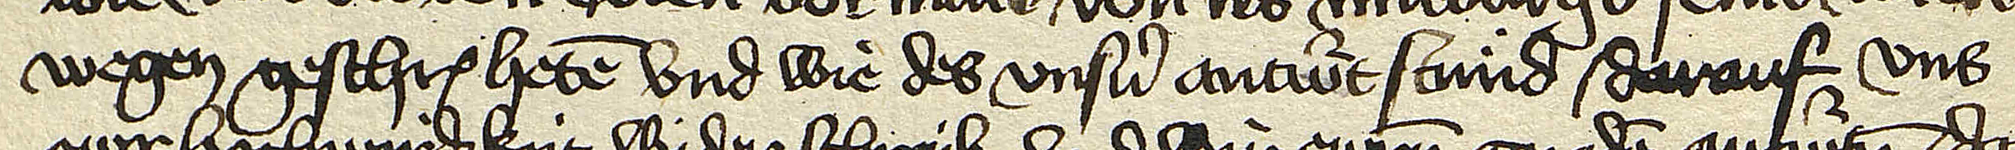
wegen geſchr* hete* vnd wie des vnſn* antwt* ſtünd / darauf vns
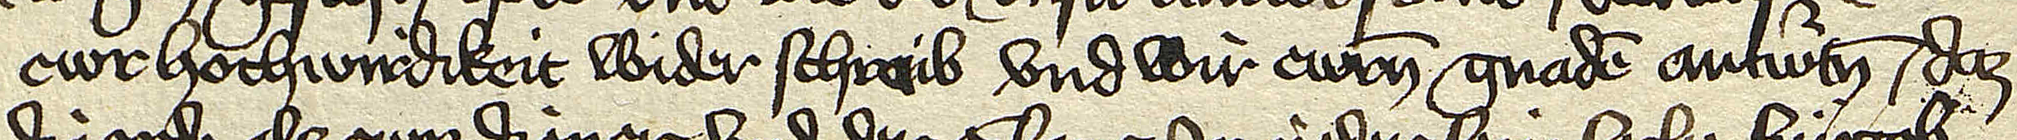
ewr hochwirdikeit wider ſchraib vnd wir ewrn* gnade* antwtn* / daʒ
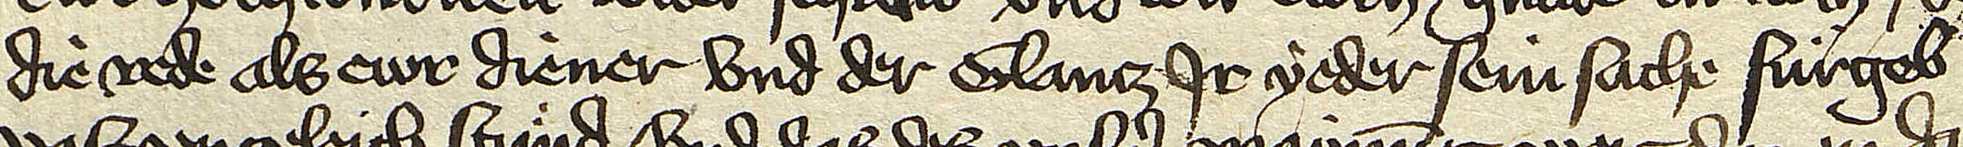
die rede als ewr diener vnd der Glancʒ Ir yeder ſein ſache fürgeb
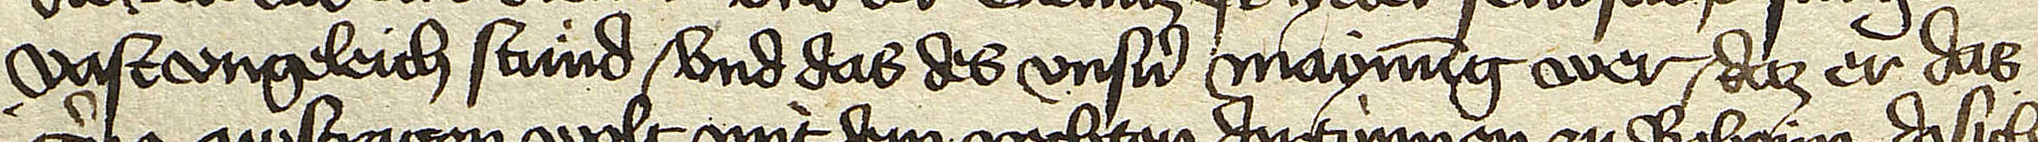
vaſt vngeleich ſtünd / vnd das des vnſn* maynug* wer / daʒ er das
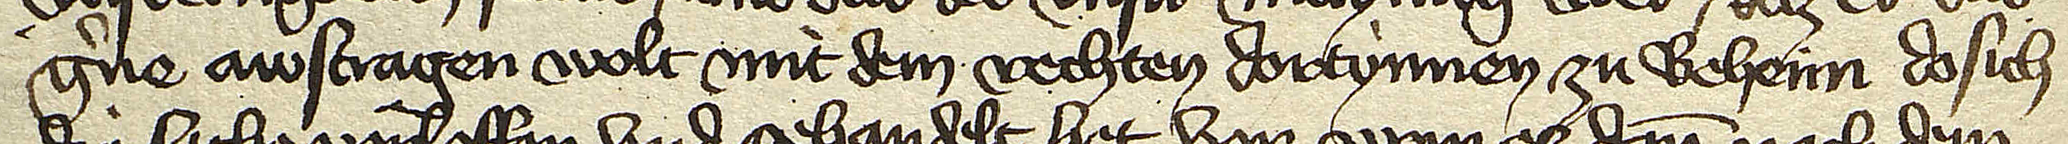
g*ne awſtragen wolt mit dem rechten dortynnen cʒu Beheim do ſich
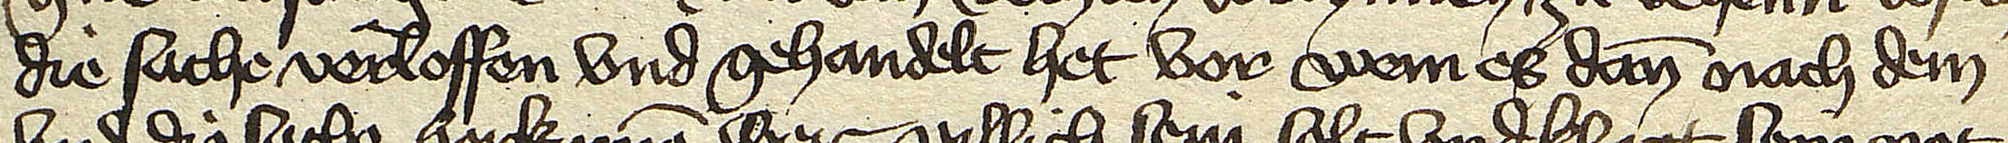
die ſache verloffen vnd gehandelt het vor wem es dan* nach dem
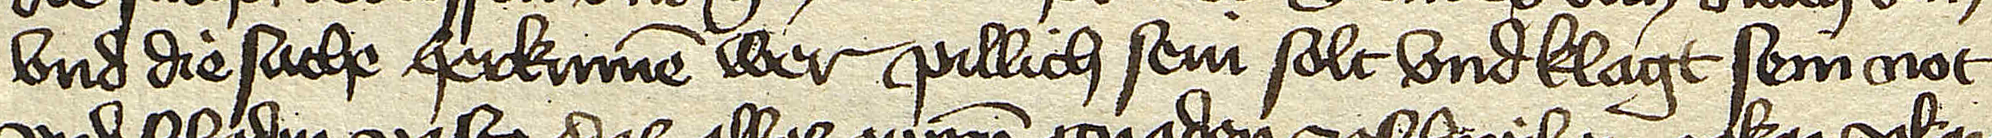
vnd die ſache herkume* wer pillich ſein ſolt vnd klagt ſein not
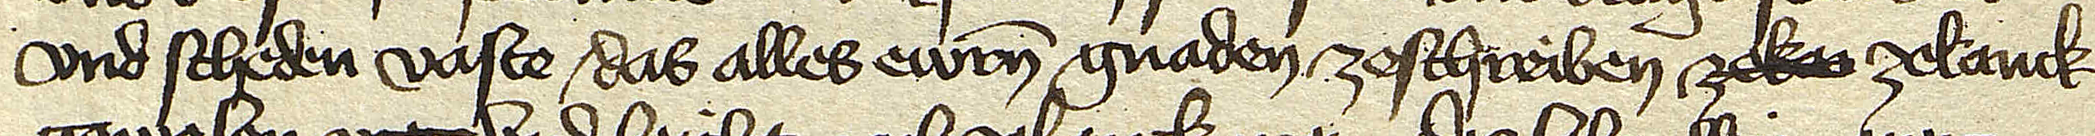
vnd ſcheden vaſte / das alles ewrn* gnaden cʒeſchreiben cʒekan cʒelanck
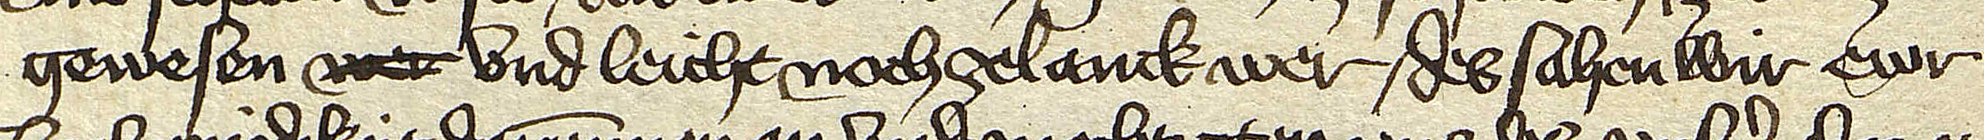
geweſen wer vnd leicht noch cʒelanck wer / des ſahen wir ewr
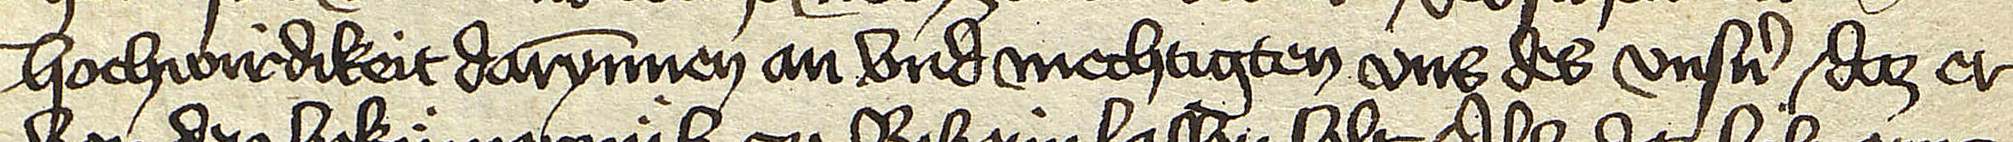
hochwirdikeit darynnen* an vnd mechtigten vns des vnſn* / daʒ er
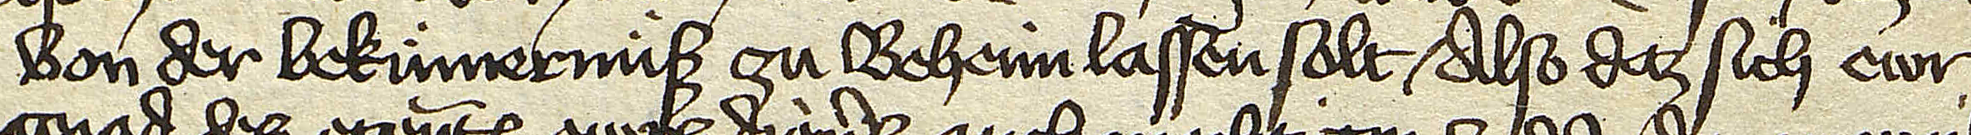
von der bekümernüſʒ cʒu Beheim laſſen ſolt / Alſo daʒ ſich ewr
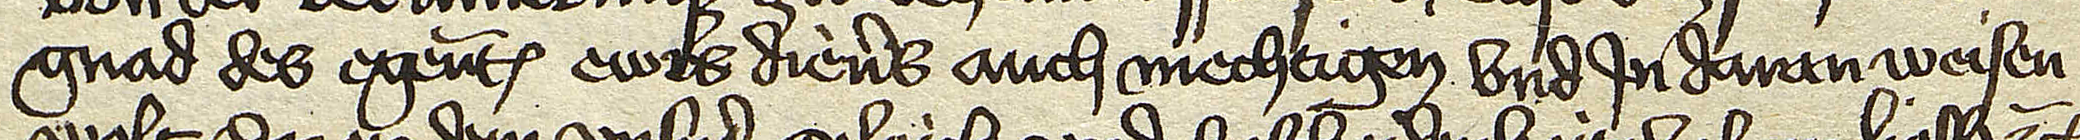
gnad des egent* ewrs dien*s auch mechtigen vnd In daran weiſen
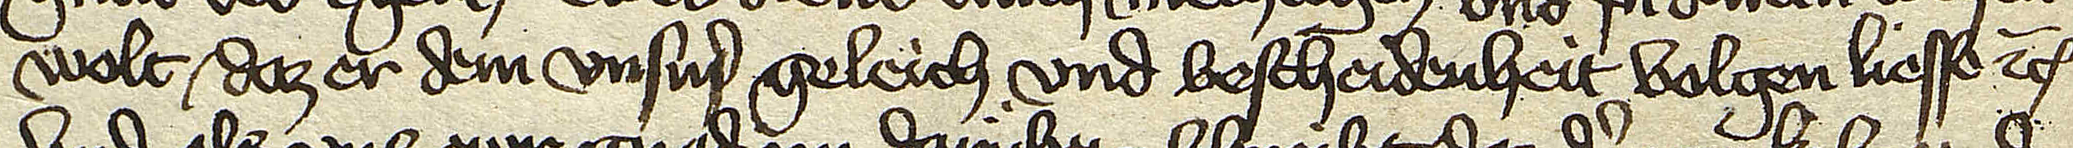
wolt / daʒ er dem vnſm* geleich vnd beſcheidenheit volgen lieſſe ec*
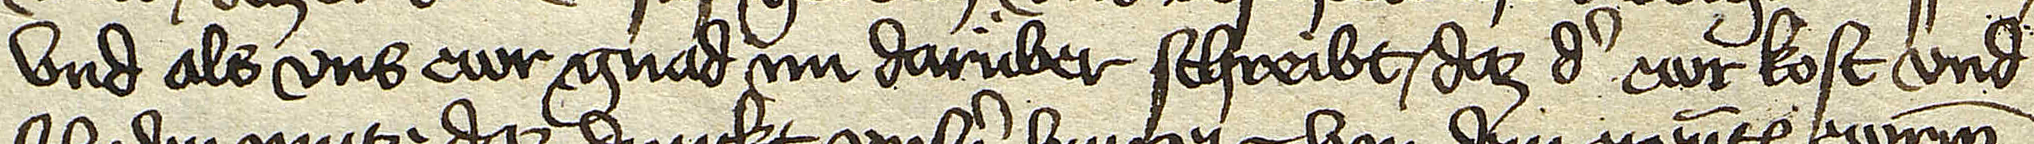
vnd als vns ewr gnad nu darüber ſchreibt / daʒ d* ewr koſt vnd
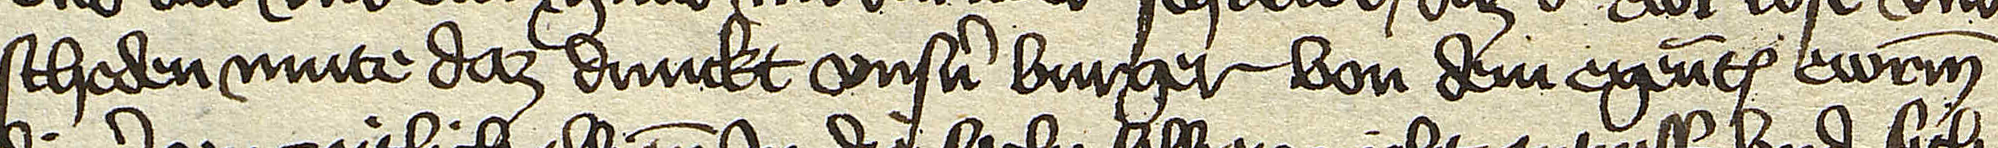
ſcheden mute daʒdunckt vnſn* burger von dem egent* ewrm*
